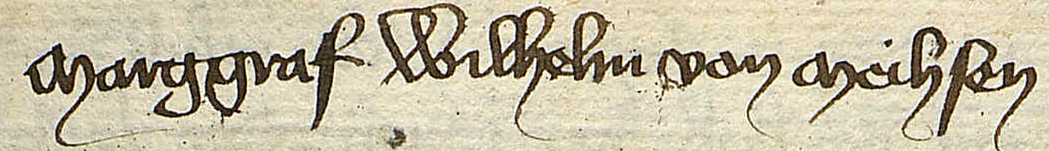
Marggraf Wilhelm von Meihſen
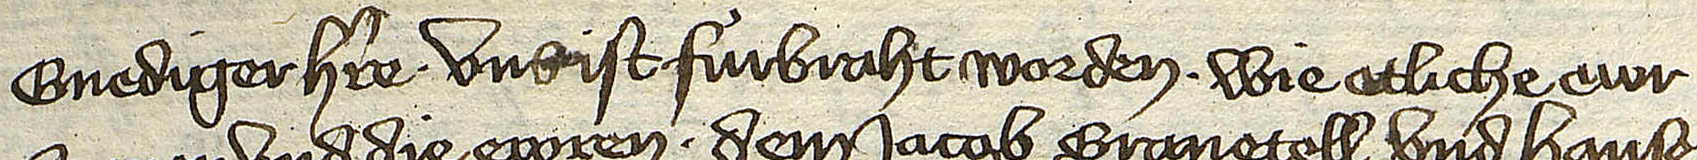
Gnediger h*re . Vns iſt fürbraht worden . wie etliche ewr
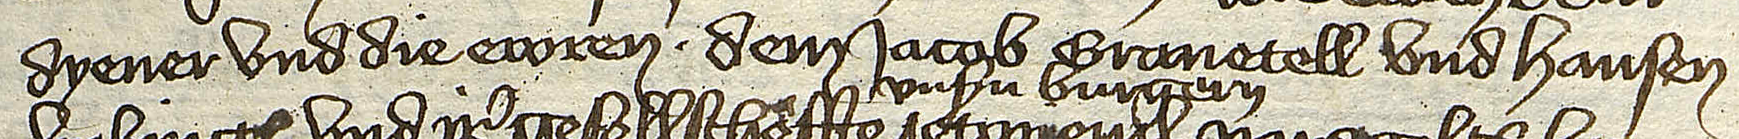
dyener vnd die ewren . dem Iacob Granetell vnd hanſen
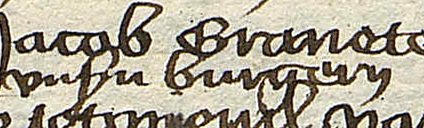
vnſ*n burgern
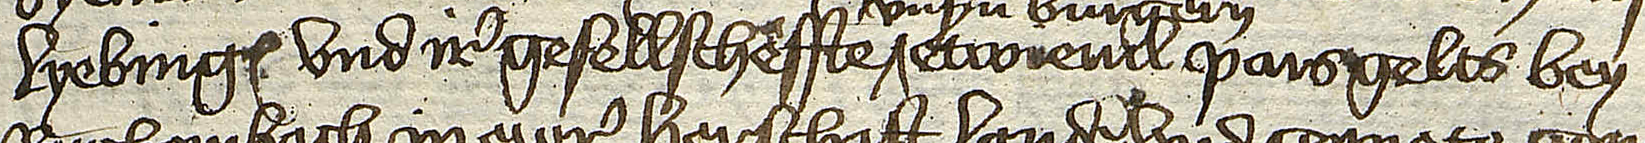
Lyebring* vnd ir* geſellſchëffte etwieuil pars gelts bey
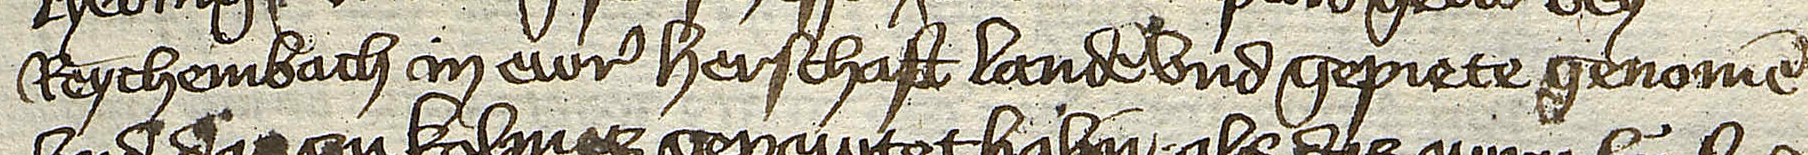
Reychembach in ew*r herſchaft lande vnd gepiete genome*
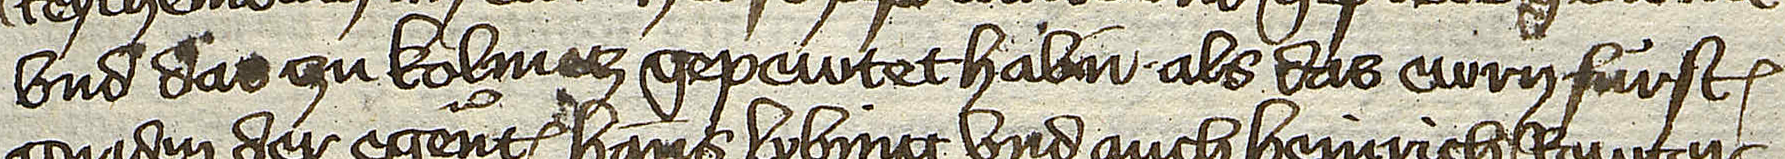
vnd das cʒu Kolmecʒ gepewtet hab*n . als das ewrn fürſt*
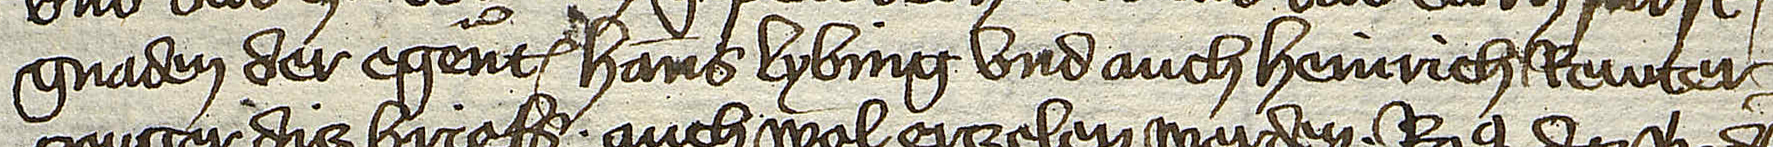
gnaden der egen*t hans lybring vnd auch heinrich Rewter
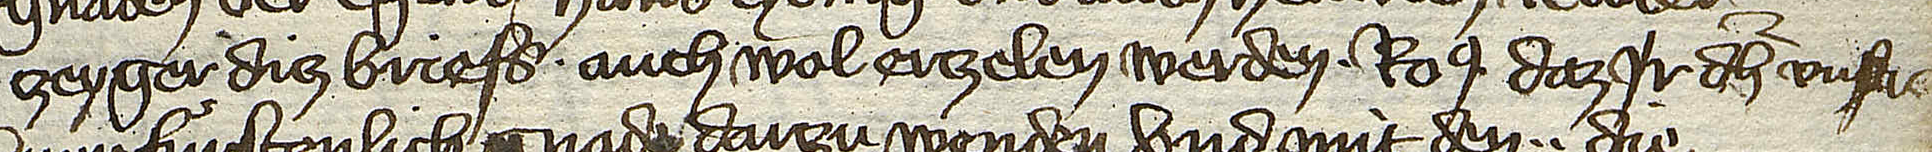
cʒeyger dicʒ briefs . auch wol ercʒelen werden . Ro* daʒ Ir d*h* vnſ*r
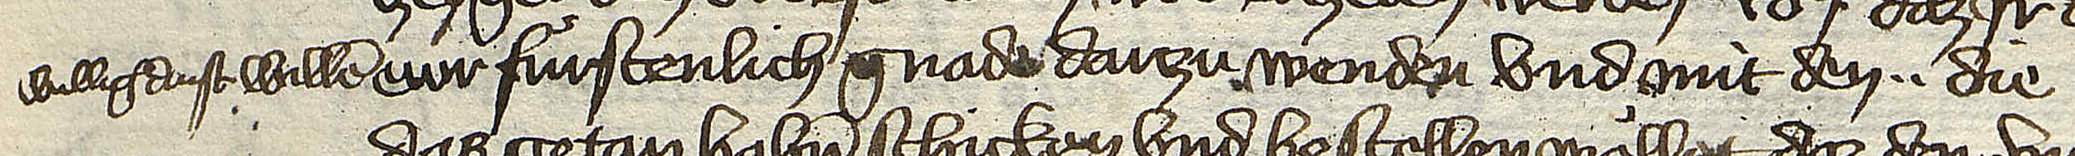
willig* dinſt wille* ewr fürſtenlich gnade darʒu wenden vnd mit den ~ die
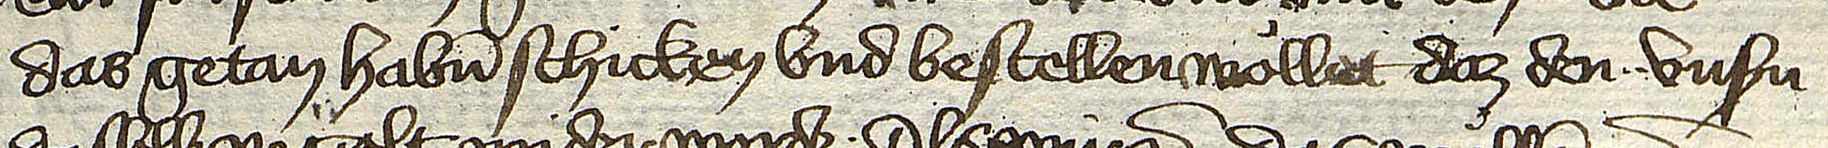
das getan hab*n ſchicken vnd beſtellen wöllet daʒ den ~ vnſ*n
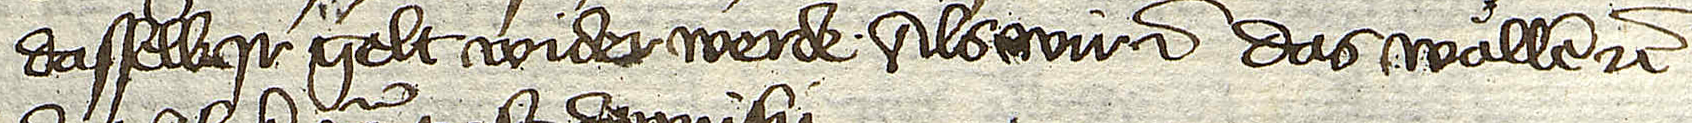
daſſelb Ir gelt wider werde . Als wir ec* das wölle* ec*
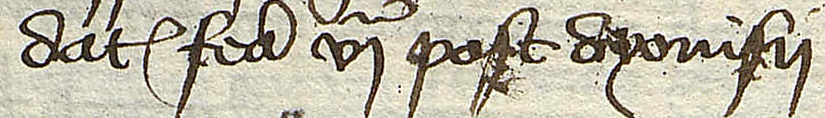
dat* fia* vi* poſt dyoniſii
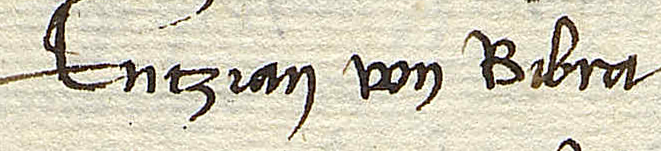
Encʒian von Bibra
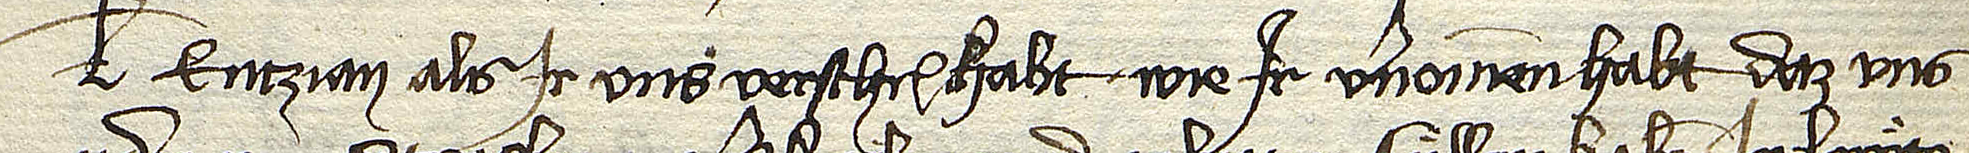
L* Encʒian als Ir vns verſchr* habt wie Ir v*nom*en habt daʒ vns
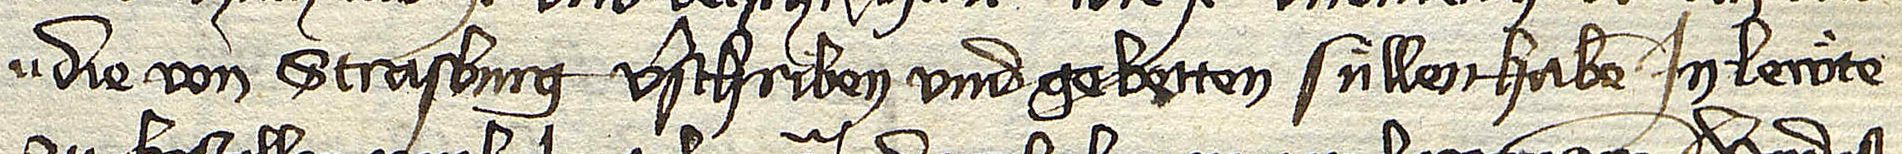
~ die von Straſburg v*ſchriben vnd gebetten ſüllen habe* In lewte
